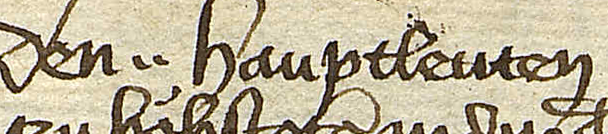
Den ~ hauptleuten
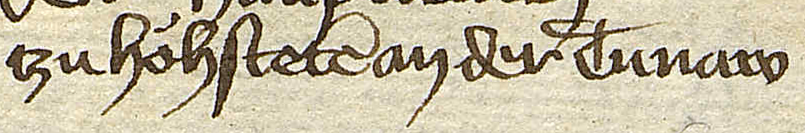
cʒu höhſtete* an der Tunaw
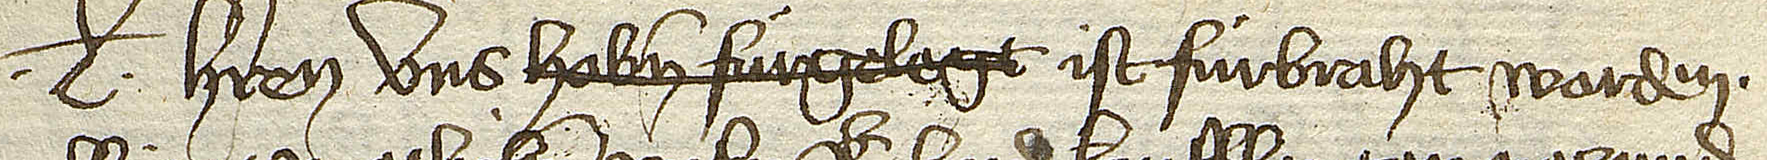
. L* . h*ren vns habn* fürgelegt iſt fürbraht worden .
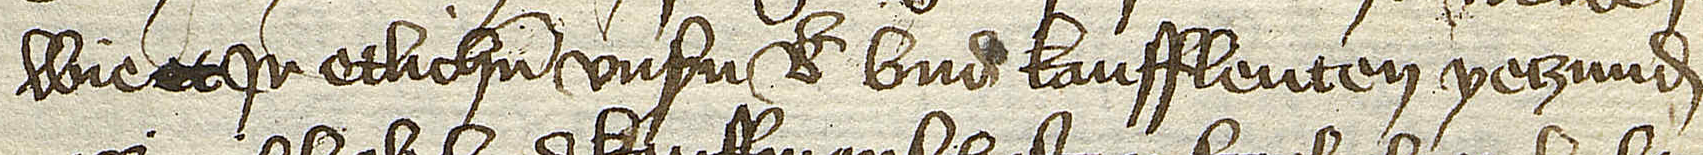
wie et Ir etlichn* vnſ*n B* vnd kauffleuten yecʒund*
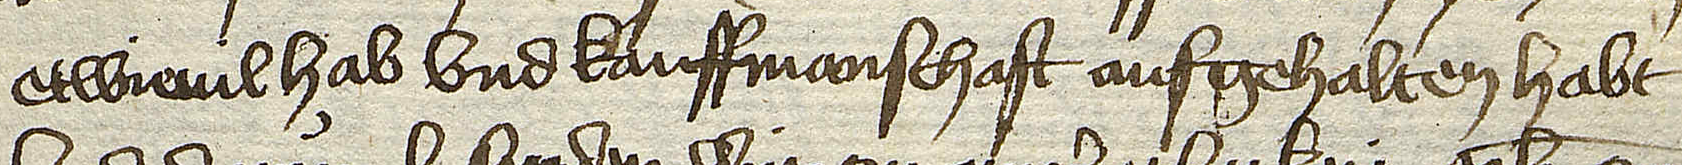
etwieuil hab vnd kauffmanſchaft aufgehalten habt
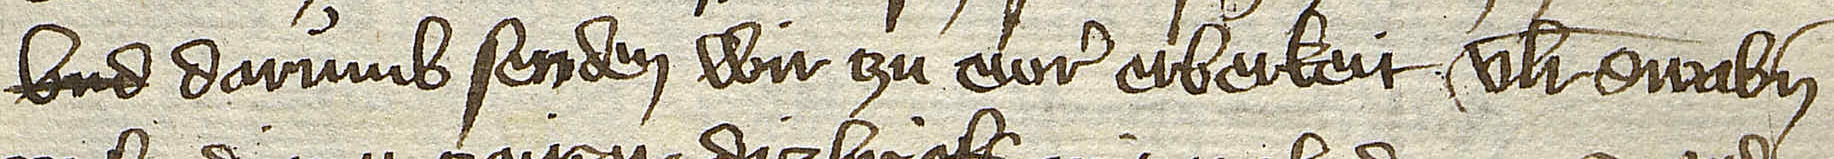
vnd darümb ſenden wir cʒu ewr* erberkeit vlr* Swabn*
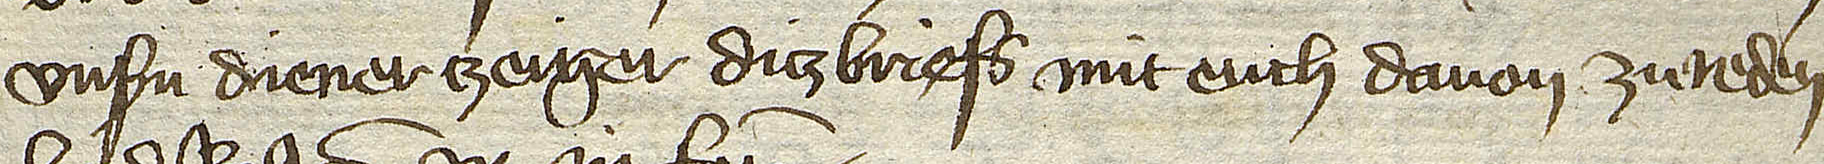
vnſ*n diener cʒeiger dicʒ briefs mit euch dauon ʒureden
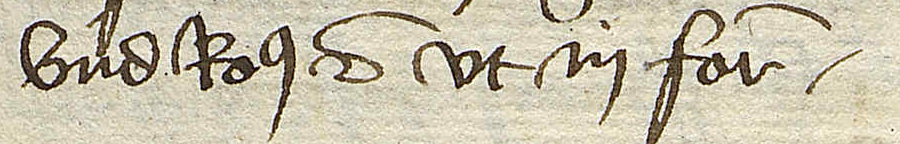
vnd Ro* ec* vt in for* /
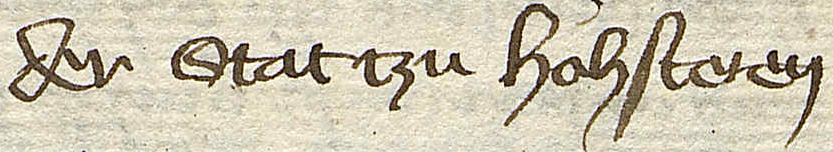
Der Stat cʒu höhſteten
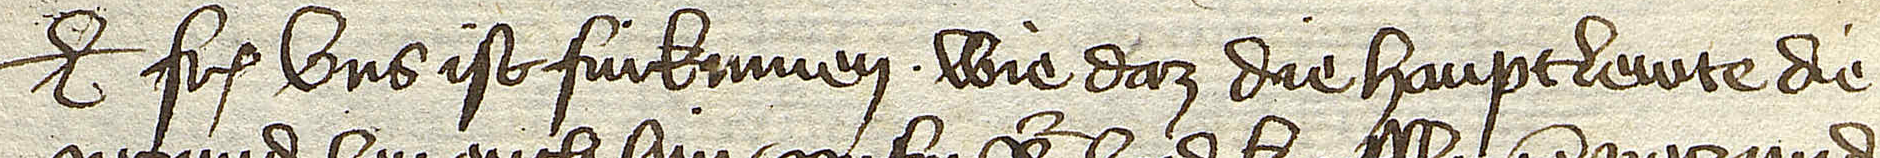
L* fr* Vns iſt fürkumen . wie daʒ die hauptlewte die
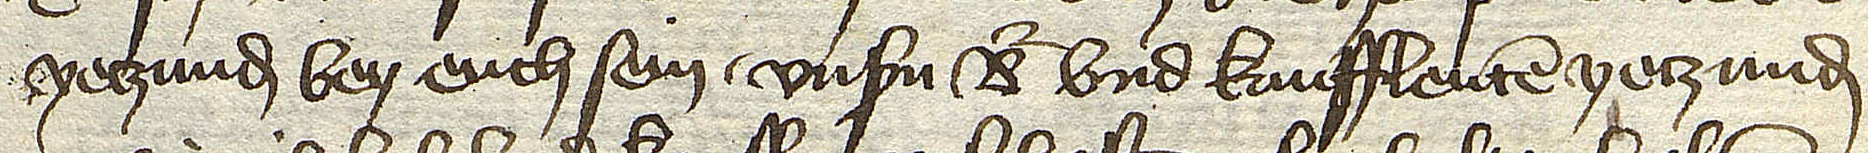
yecʒund* bey euch ſein / vnſ*n B* bnd kauffleute* yecʒund*
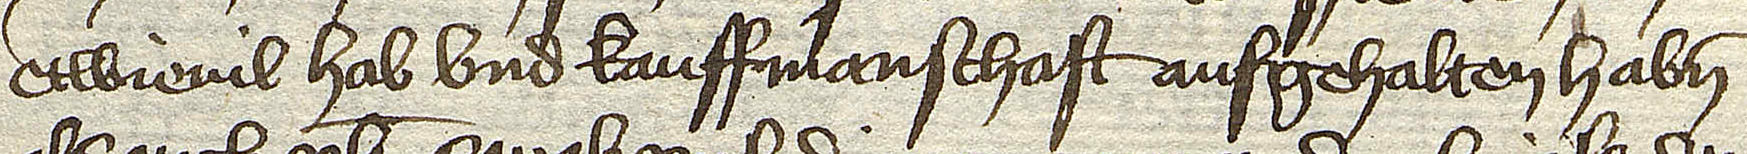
etwieuil hab vnd kauffmanſchaft aufgehalten habn*
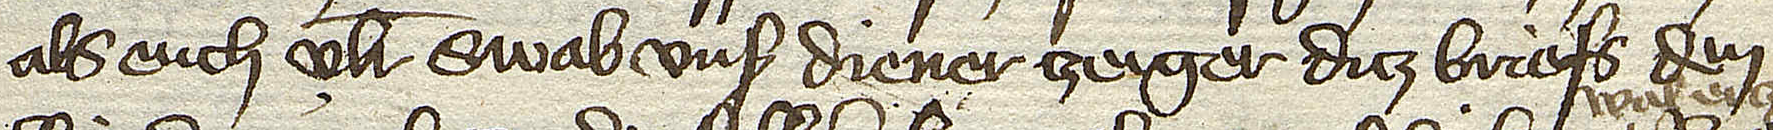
als euch vlr* Swab vnſ* diener cʒeiger dicʒ briefs den
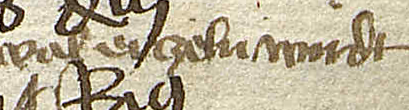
wol ercʒeln wirdt
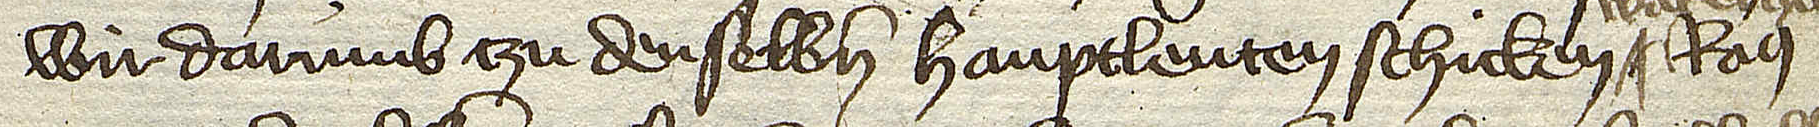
wir darümb cʒu denſelbn* hauptleuten ſchicken / Ro*
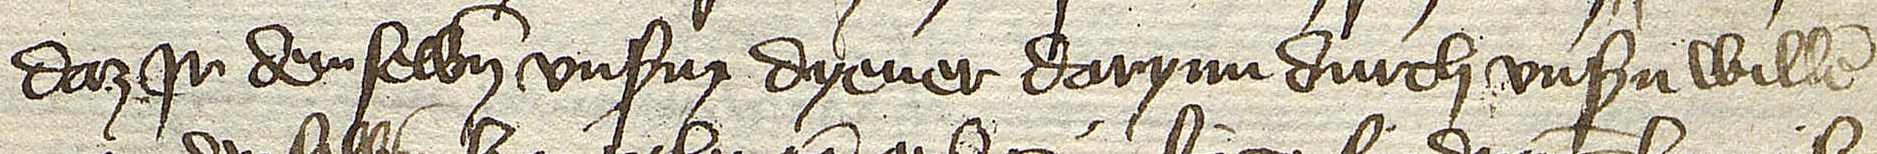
daʒ Ir demſelbn* vnſ*m dyener darynn durch vnſ*n wille*
